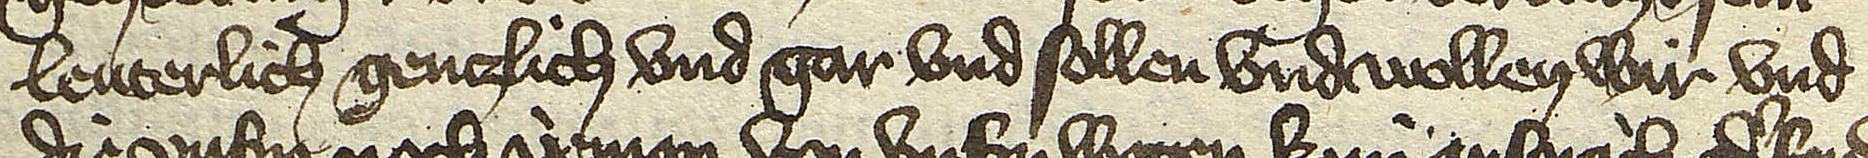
leuterlich gencſʒlich vnd gar vnd ſollen vnd wollen wir vnd
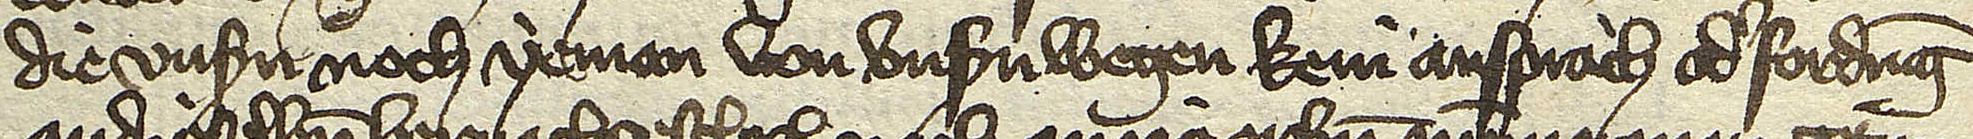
die vnſ*n noch yeman von vnſ*n wegen kein anſprach od* fordrug*
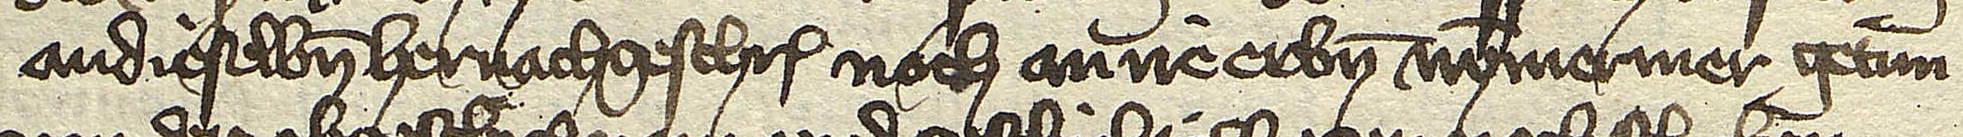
andieſelbn* hernach geſchr* noch an ire erbn* ny*mermer getun
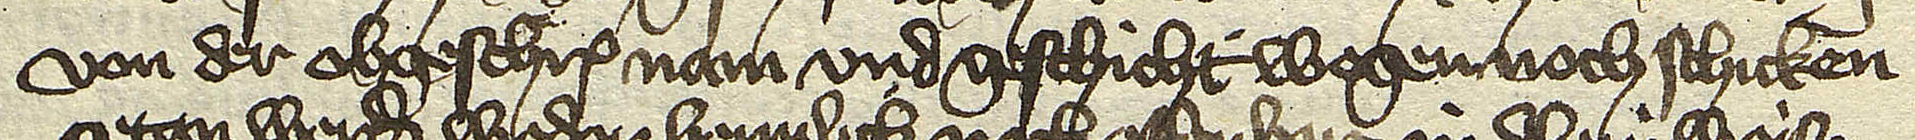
von der obgeſchr* nam vnd geſchicht wegen noch ſchicken
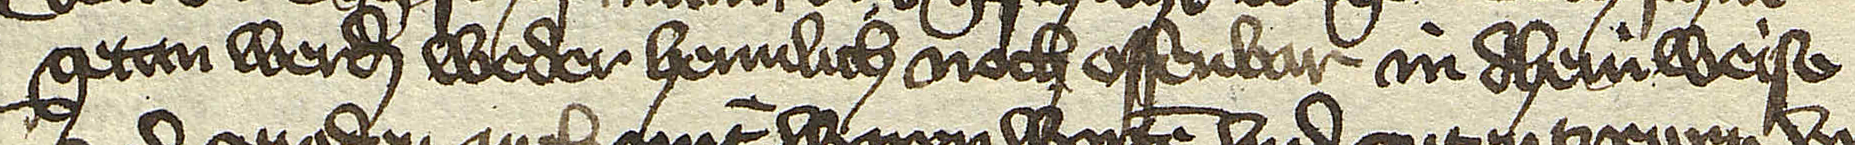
getan werd* weder heimlich noch offenbar in dhein weiſe
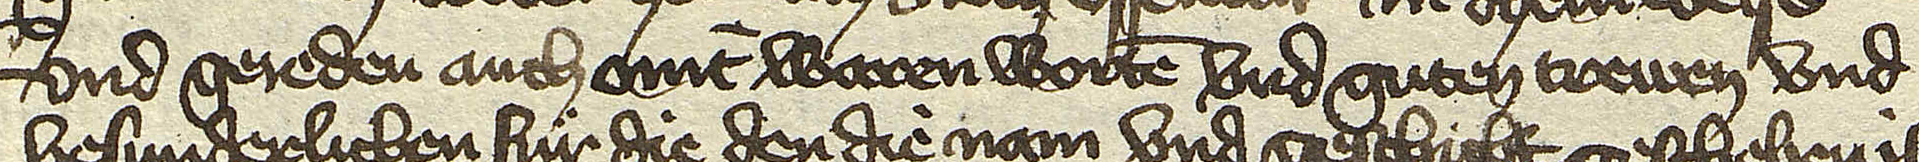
Vnd gereden auch mit waren worte* vnd guten trewen vnd
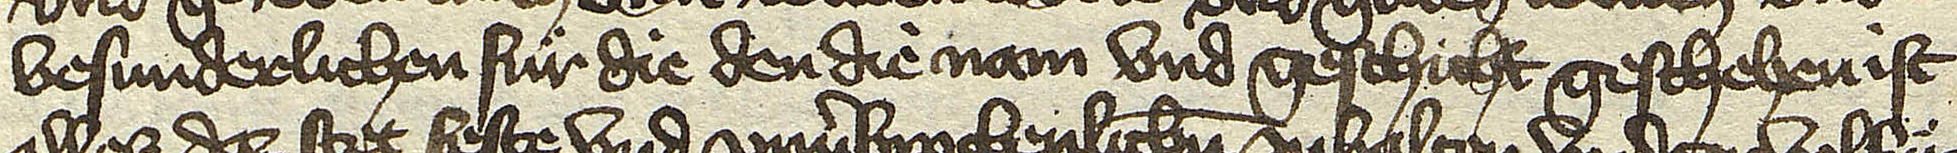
beſunderlichen für die den die nam vnd geſchicht geſchehen iſt
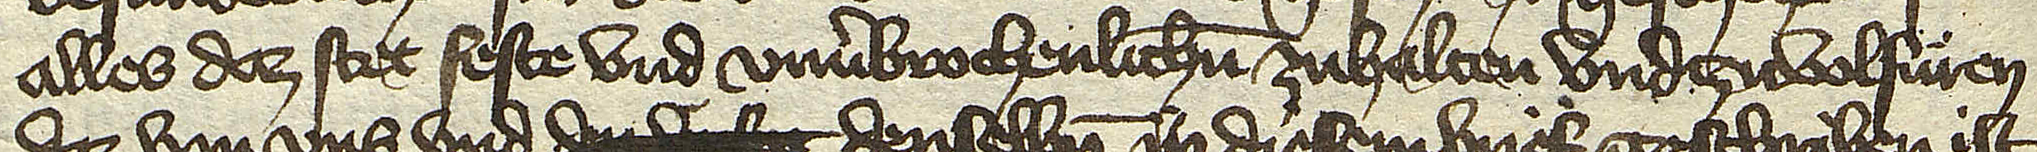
alles daʒ ſtet feſte vnd vnu*brochenlichn* cʒuhalten vnd cʒuvolfüren
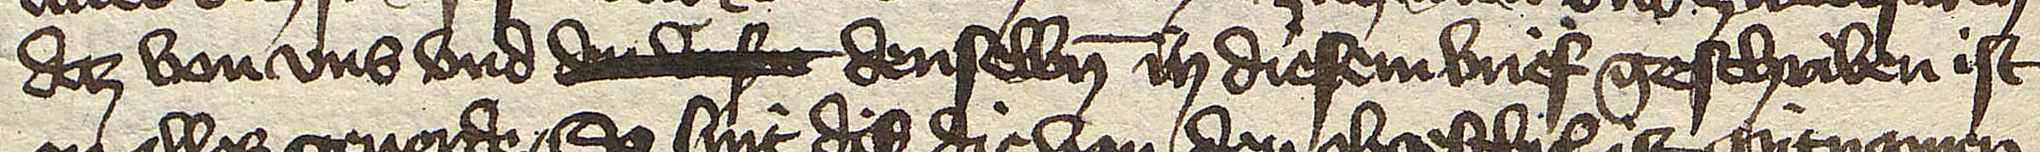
daʒ von vns vnd den vnſ*n denſelbn* in dieſem brief geſchriben iſt
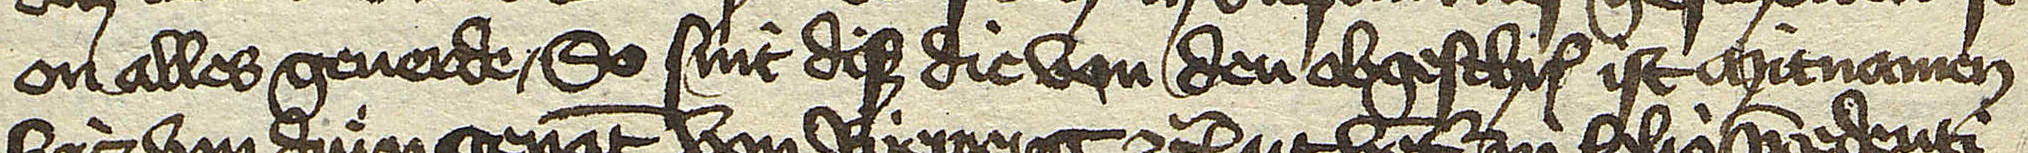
on alles geuerde / So ſint diſʒ die von den obgeſchr* iſt Mitnamen
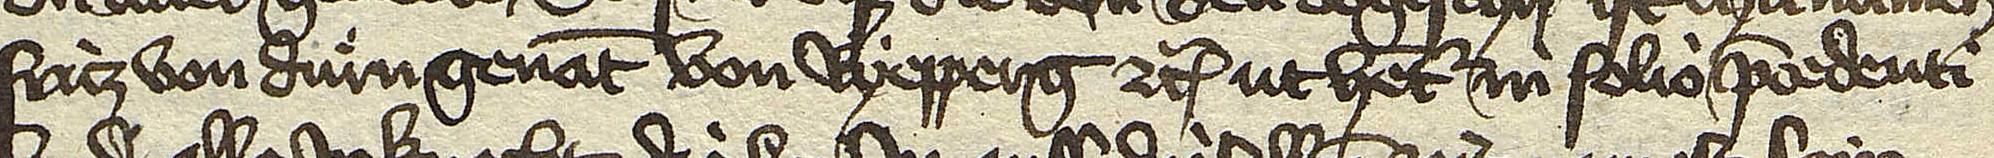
fricʒ dürn genat* von Ryepperg ec* ut het* in folio poedenti*
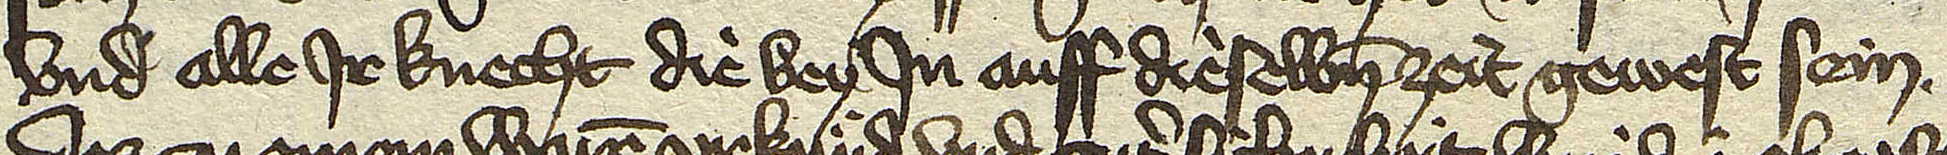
vnd alle Ir knecht die bey In auff dieſelbn* cʒeit geweſt ſein .
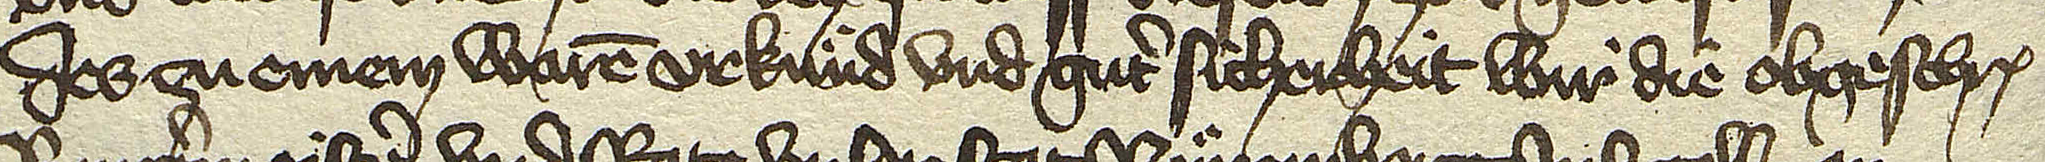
des cʒu einem ware* vrkünd vnd gut* ſicherheit wir die obgeſchr*
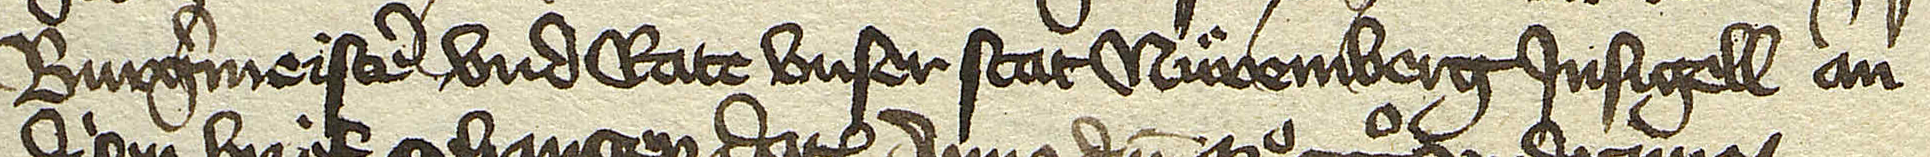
Burg*meiſte* vnd Rate vnſer ſtat Nüremberg Inſigell an
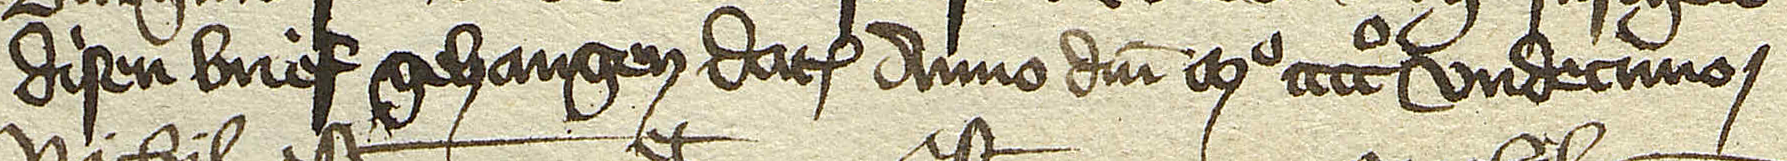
diſen brief gehangen dat* Anno din* M* cccc* vndecimo /
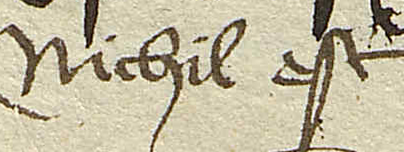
Nichil eſt
